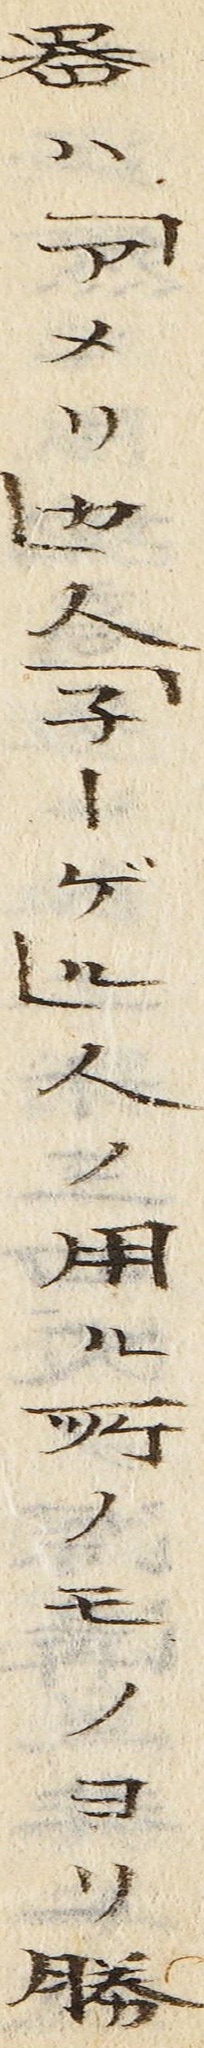器ハ「アメリカ」人「ネーゲル」人ノ用ル所ノモノヨリ勝
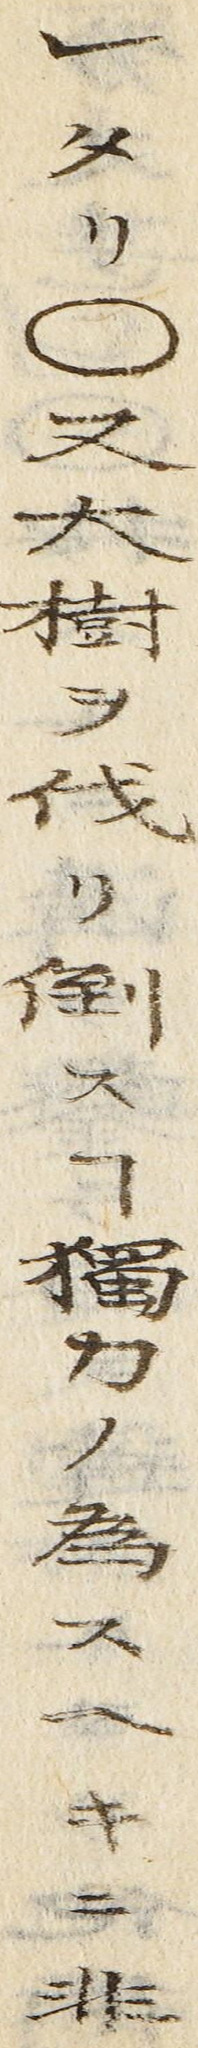レタリ◯又大樹ヲ伐リ倒スコト独力ノ為スヘキニ非
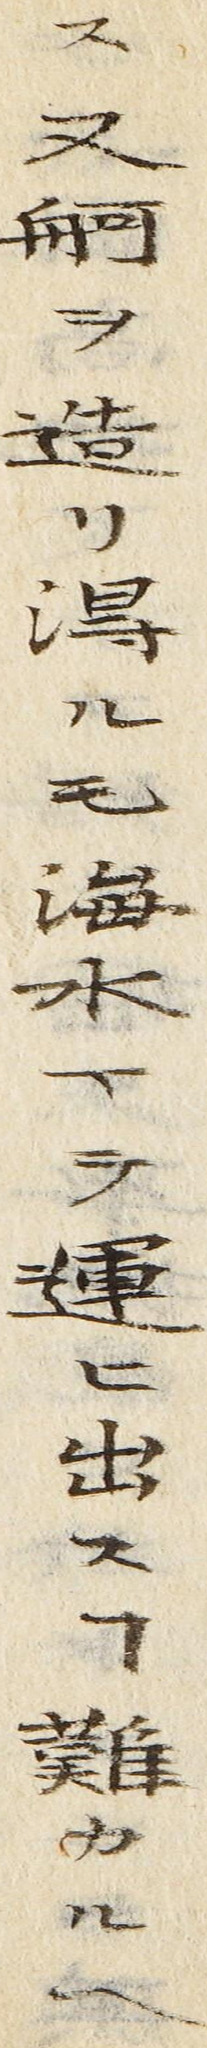ス又舸ヲ造リ得ルモ海水マテ運ヒ出スコト難カルヘ
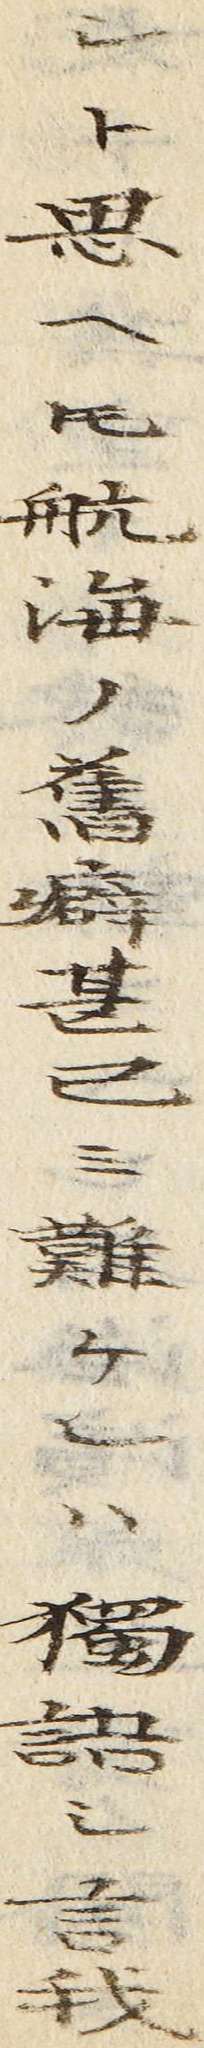シト思ヘトモ航海ノ旧癖甚已ミ難ケレハ独語シ言我
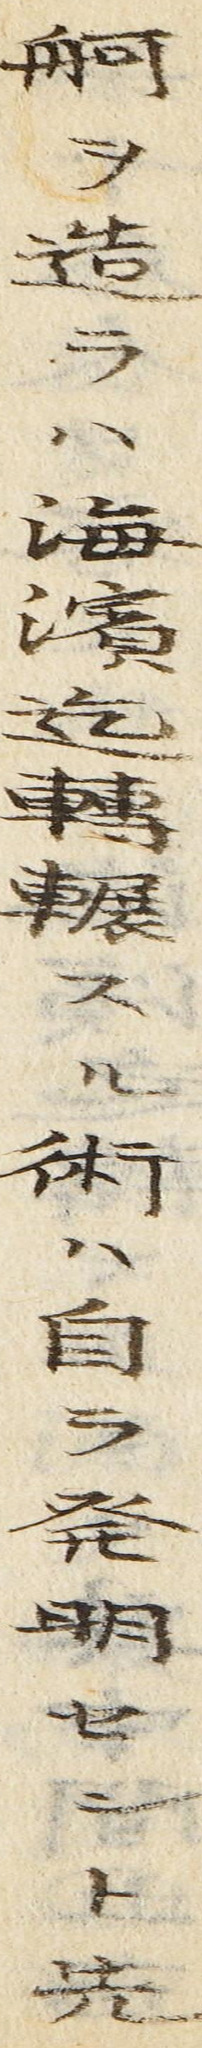舸ヲ造ラハ海浜迄転輾スル術ハ自ラ発明セント先
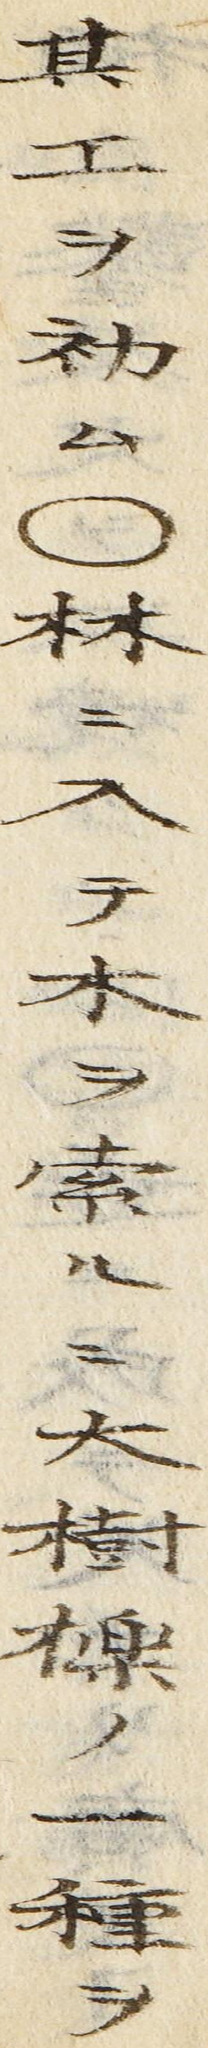其工ヲ初ム◯林ニ入テ木ヲ索ルニ大樹櫟ノ一種ヲ
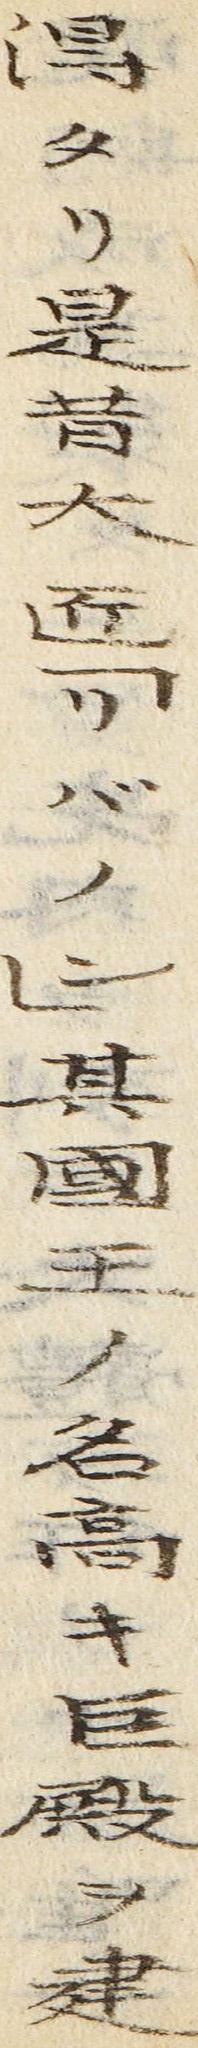得タリ是昔大匠「リバノン」其国王ノ名高キ巨殿ヲ建
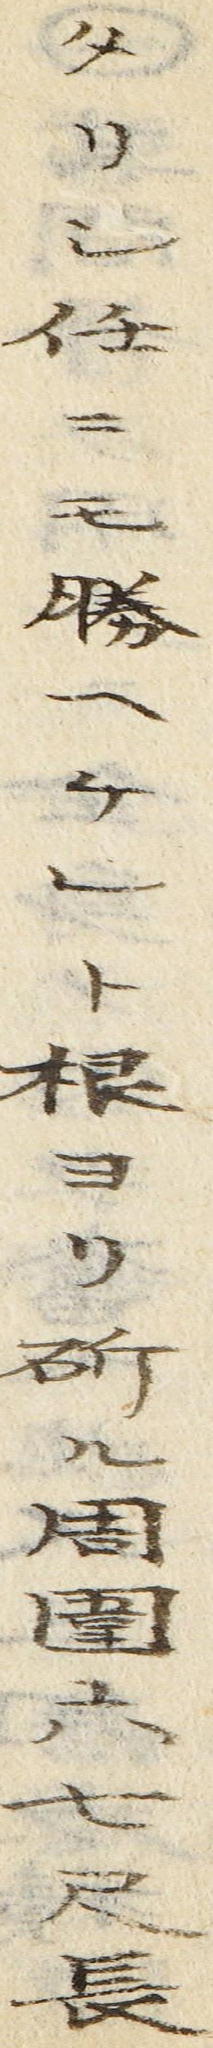タリシ任ニモ勝ヘケレト根ヨリ斫ル周囲六七尺長
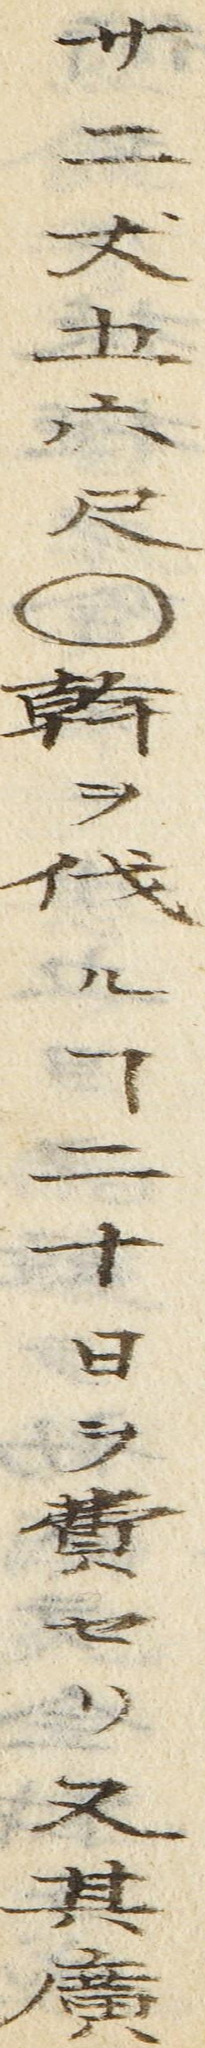サ二丈五六尺◯幹ヲ伐ルコト二十日ヲ費セリ又其広

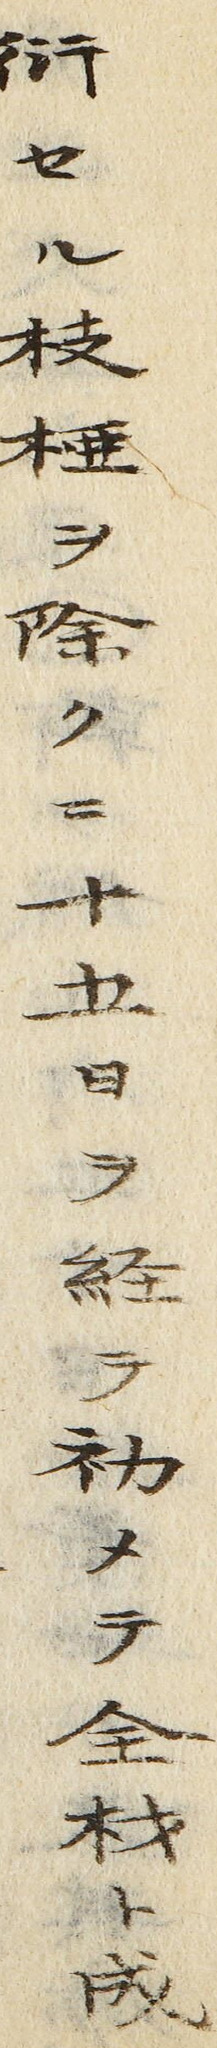衍セル枝椏ヲ除クニ十五日ヲ経テ初メテ全材ト成
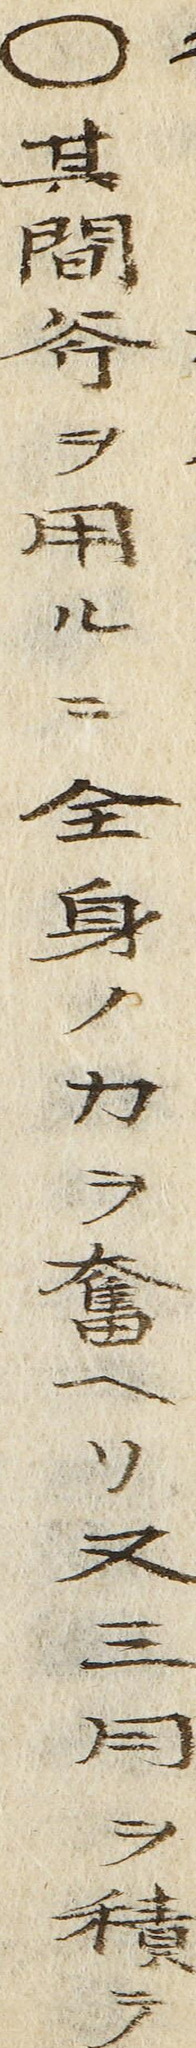◯其間斧ヲ用ルニ全身ノ力ヲ奮ヘリ又三月ヲ積テ
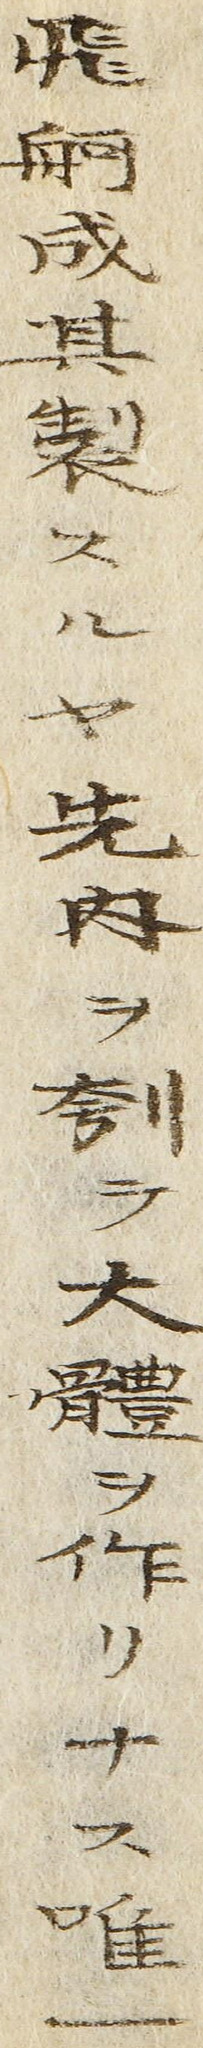飛舸成其製スルヤ先内ヲ刳テ大体ヲ作リナス唯一
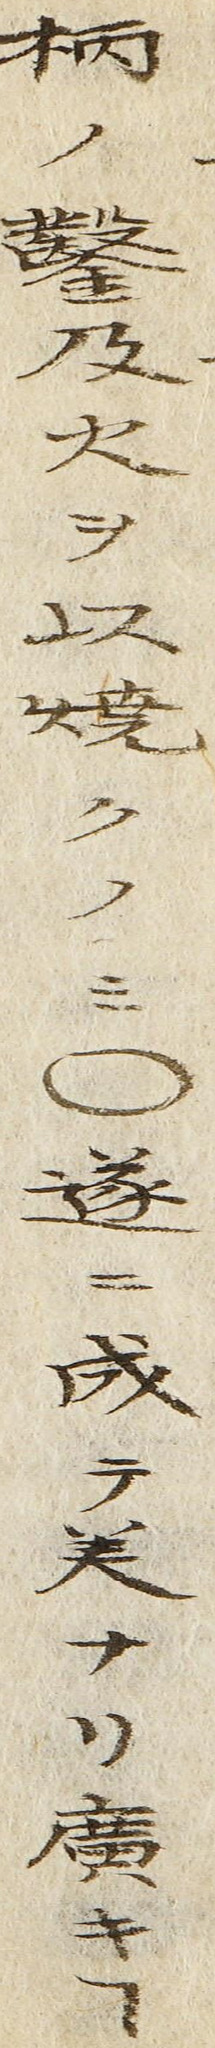柄ノ鑿及火ヲ以焼クノミ◯遂ニ成テ美ナリ広キコト
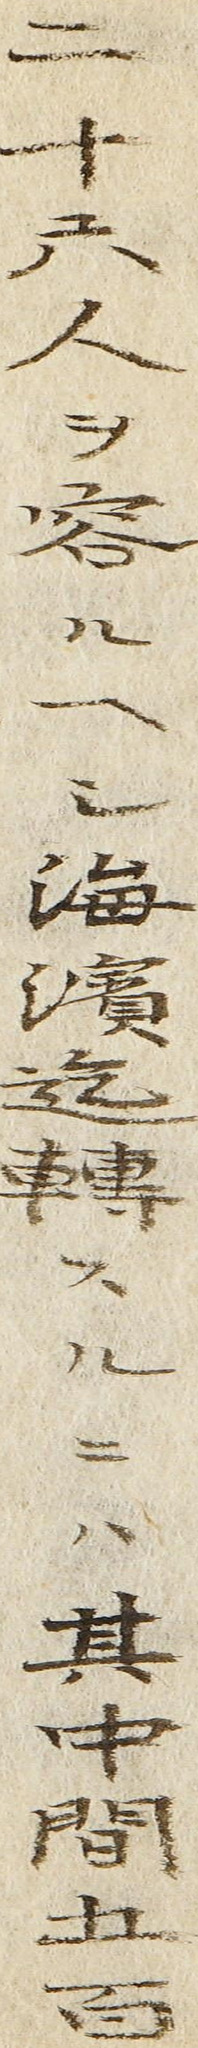二十六人ヲ容ルヘシ海浜迄転スルニハ其中間五百
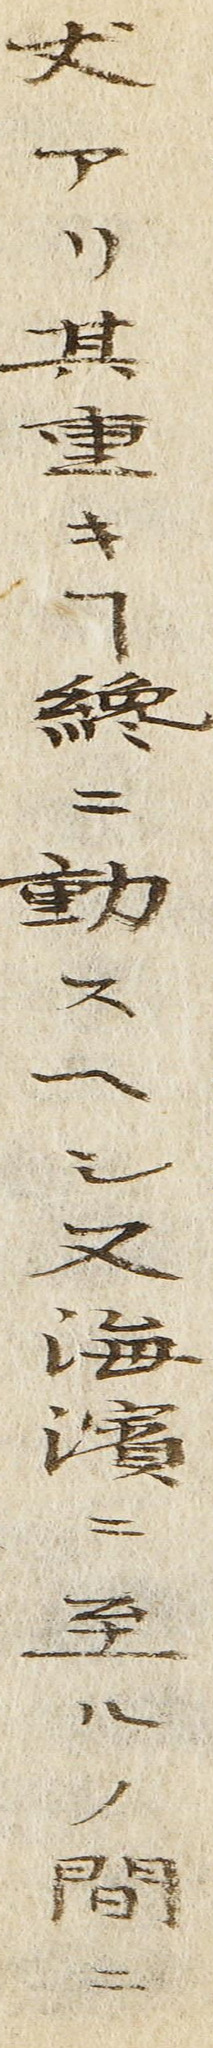丈アリ其重キコト纔ニ動スヘシ又海浜ニ至ルノ間ニ
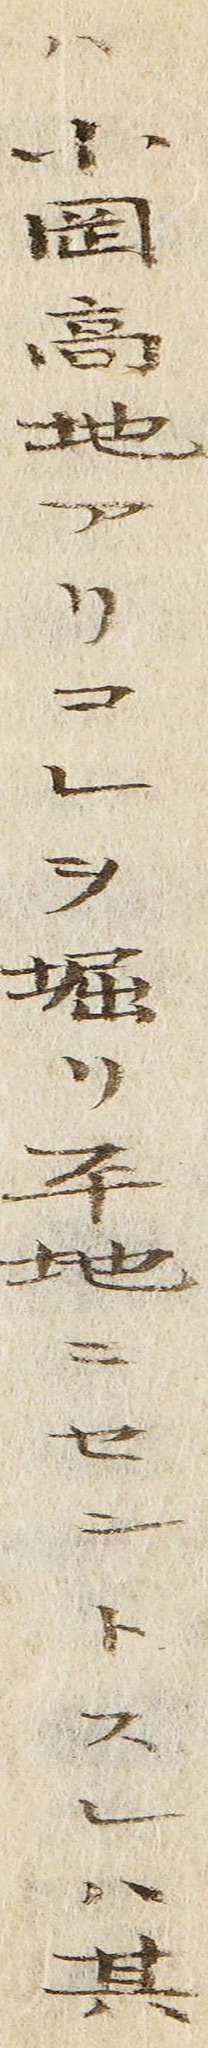ハ小岡高地アリコレヲ掘リ平地ニセントスレハ其
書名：漂流紀事
